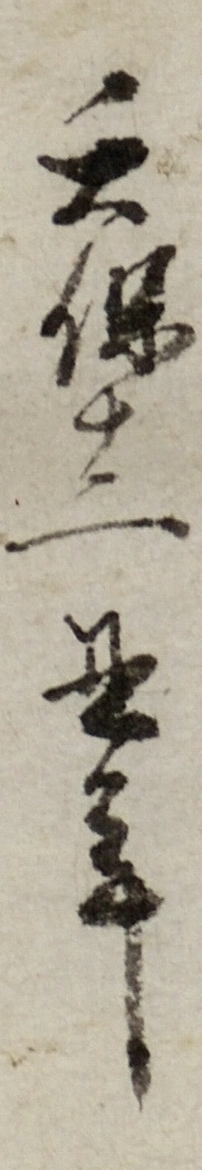天保十二丑年
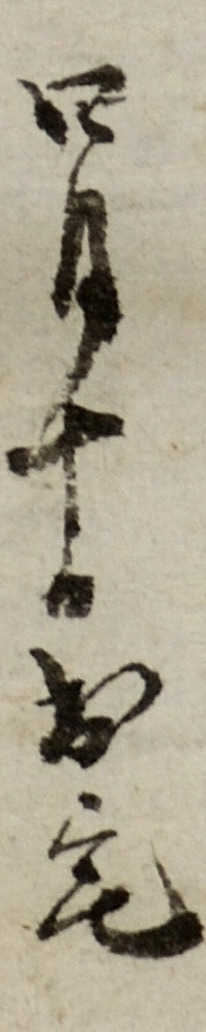四月十日出宅
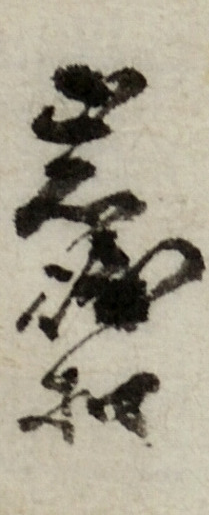岩崎扣
